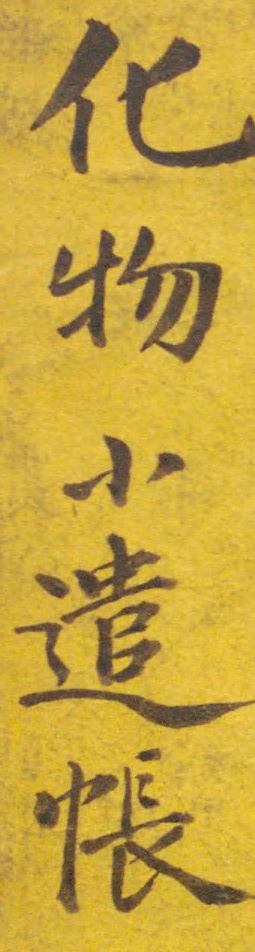化物小遣帳

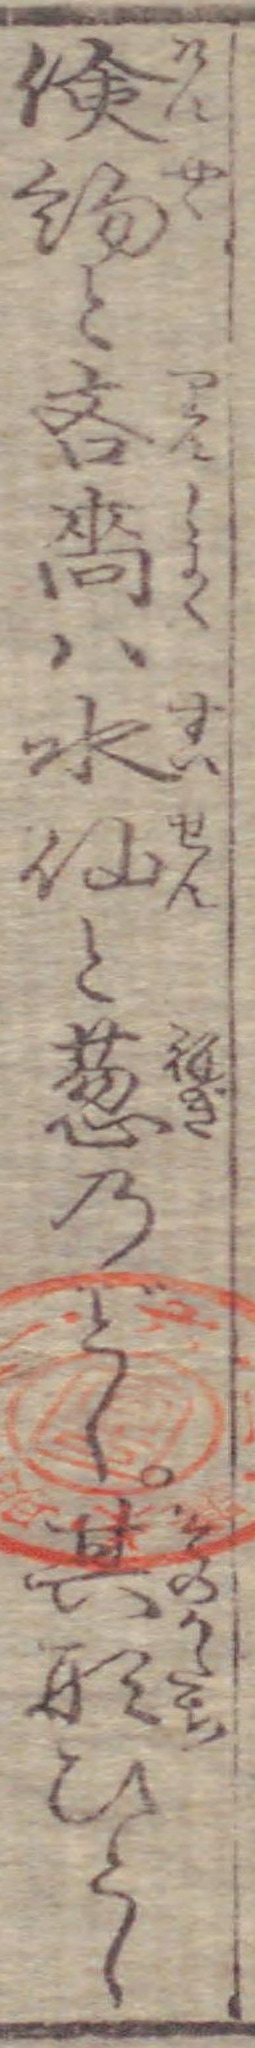倹約と吝嗇は水仙と葱のごとく。其形ひとし
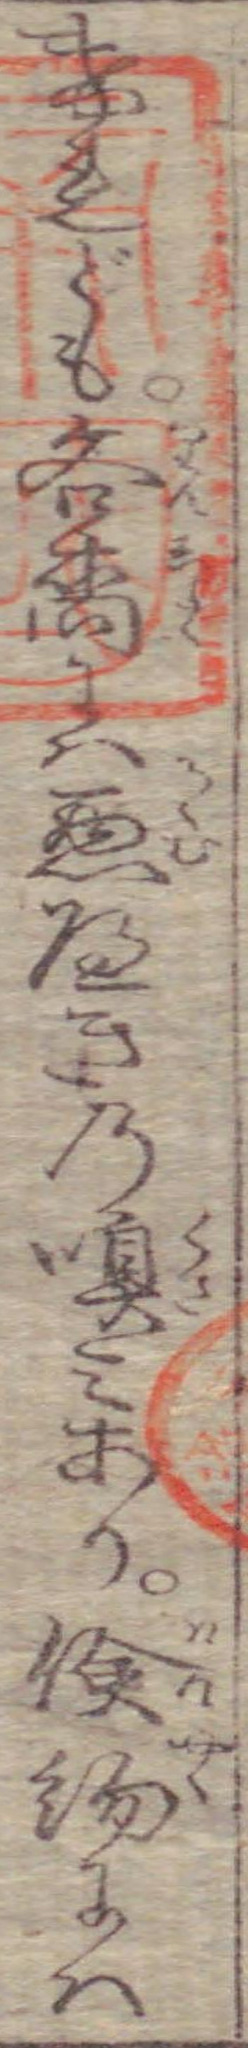けれども。吝嗇には悪へきの嗅みあり。倹約には
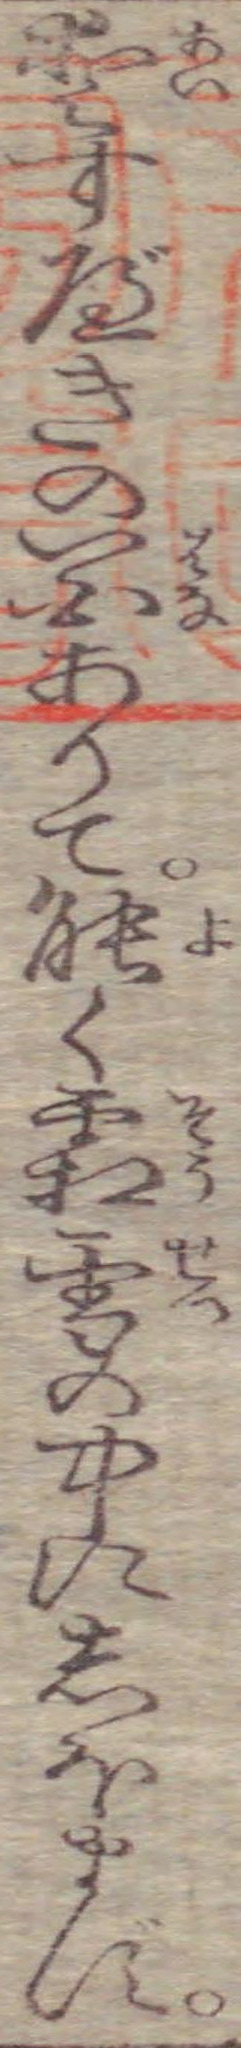愛すべきの花ありて。能く霜雪の中にしほまず。
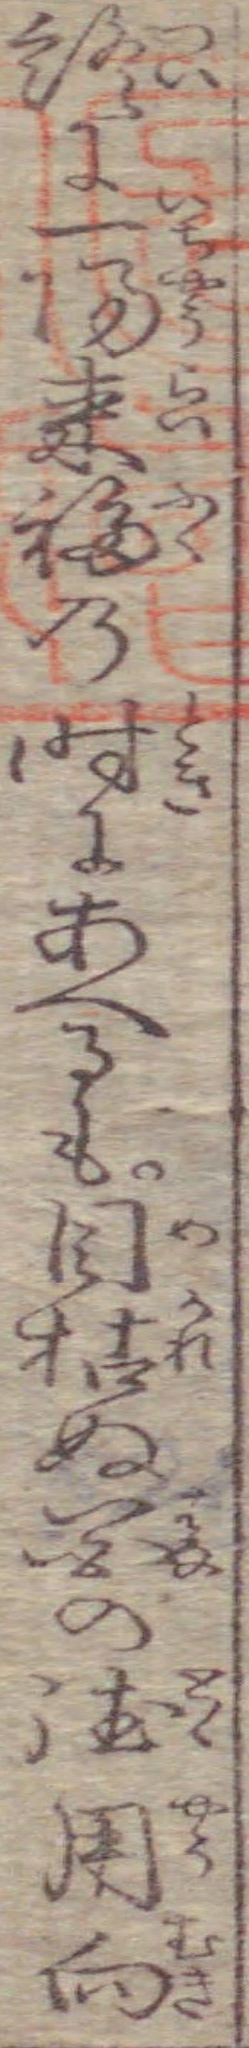終に一陽来福の時にあへるも。目枯ぬ花の徳用向
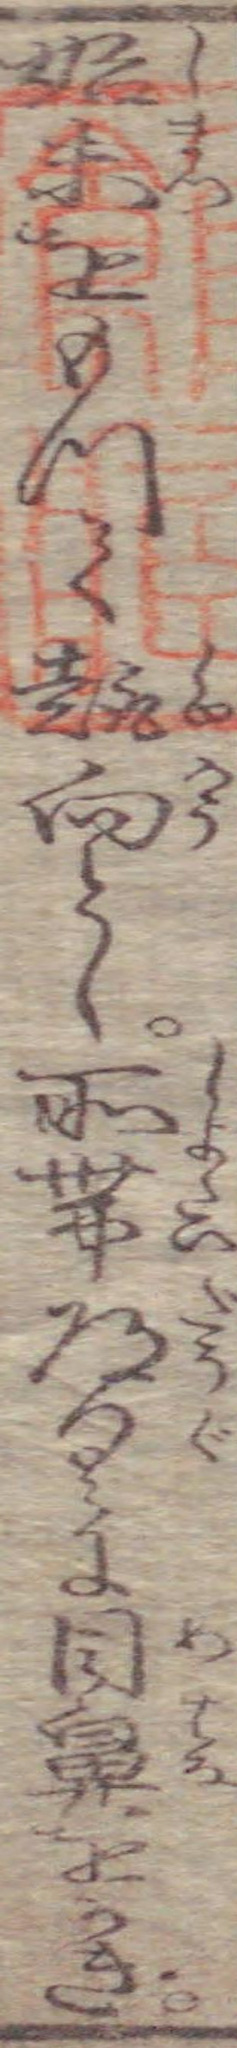始末をもつて趣向とし。所帯道具に目鼻をかき。
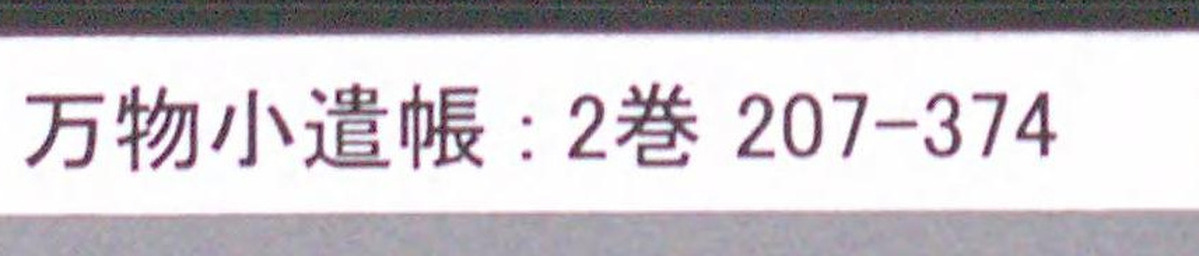万物小遣帳叙
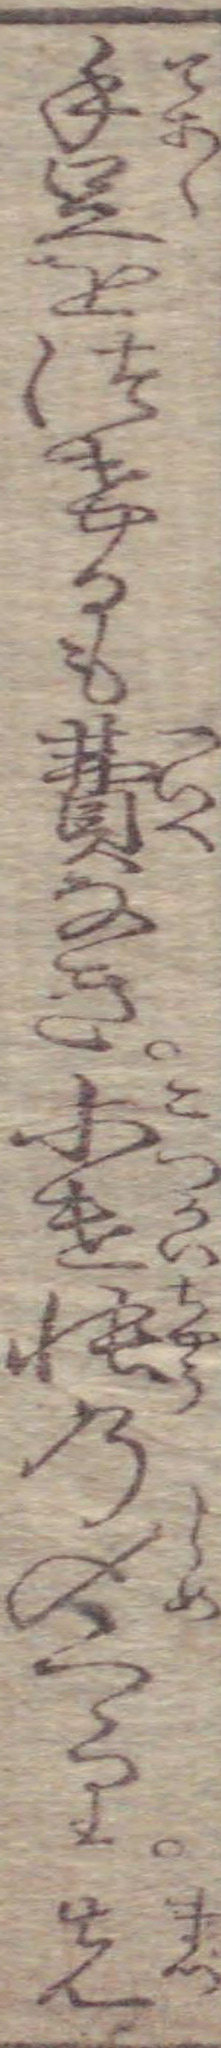手足をつけるも費なき。小遣帳の〆くゝり。先
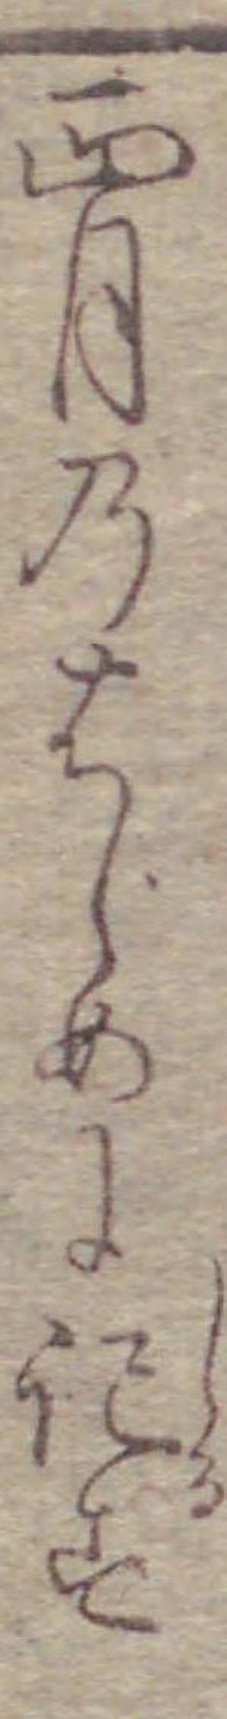正月のはじめに記す

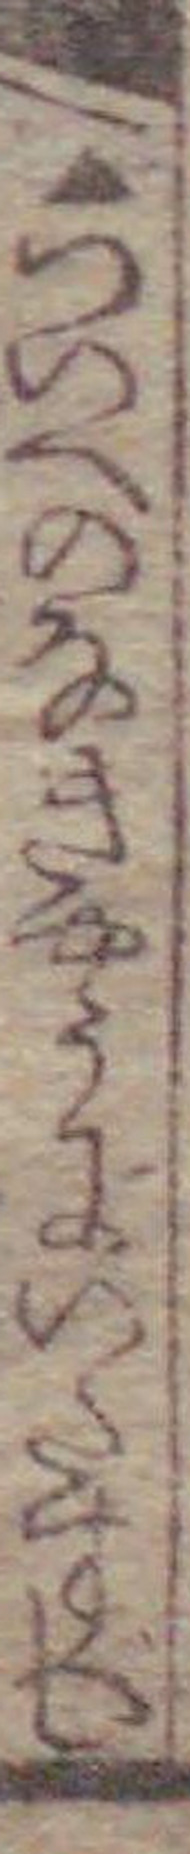▲ついへのなきやうにいたすべし
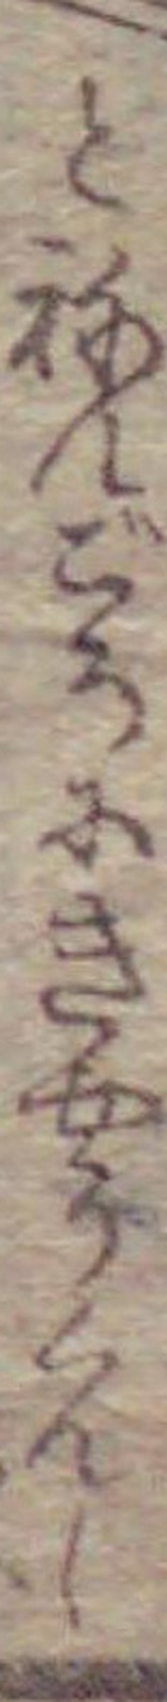とねんごろにきやうくんし
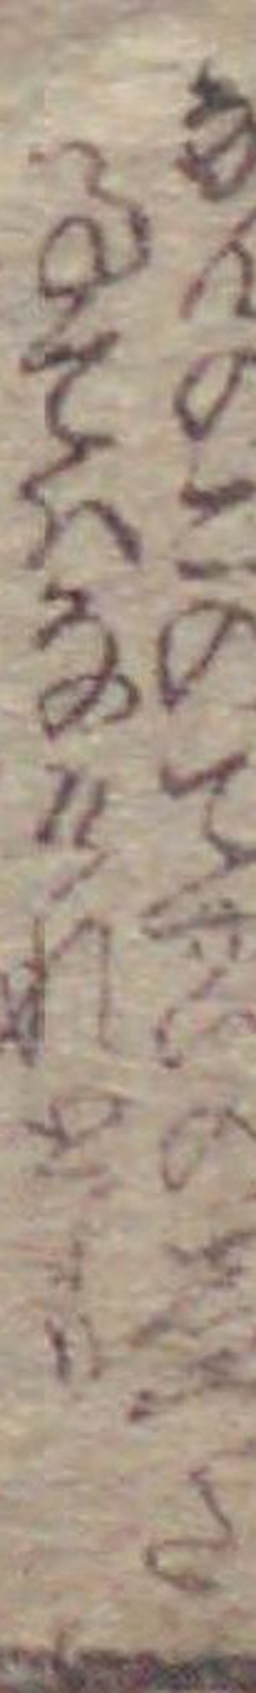事てはなけれとも
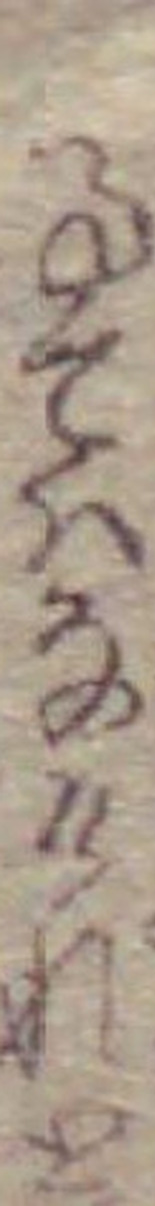事てはなけれとも
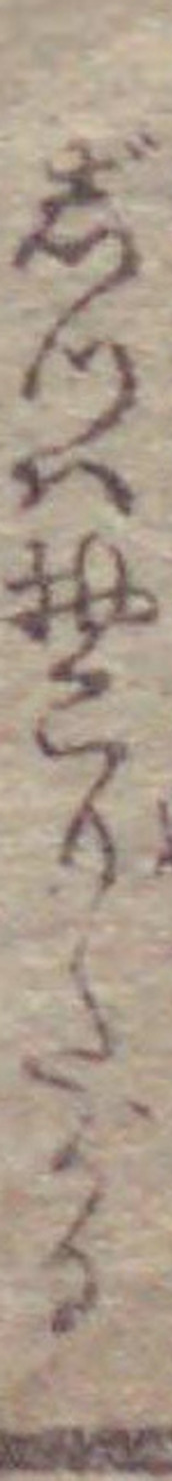じつはおこりたかる
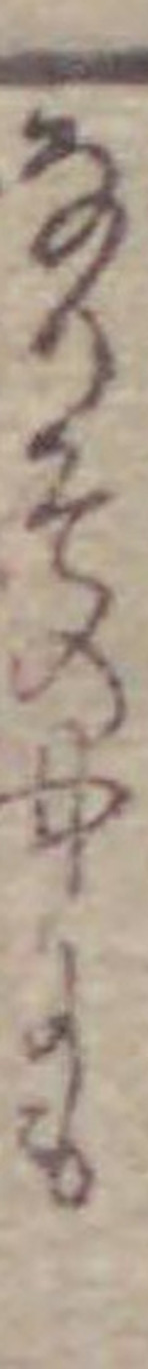なりその中にも
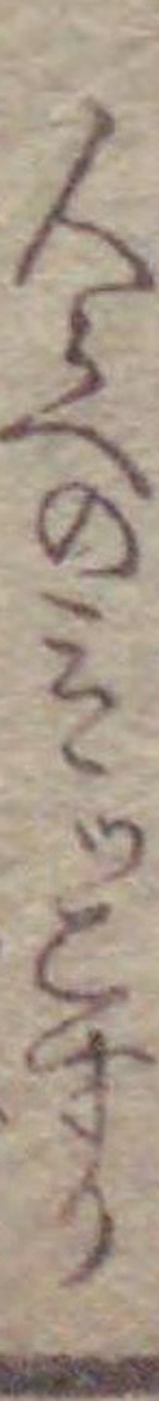人らへのみゝっこすり
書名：万物小遣帳 : 2巻
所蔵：国立国会図書館 National Diet Library, JAPAN
